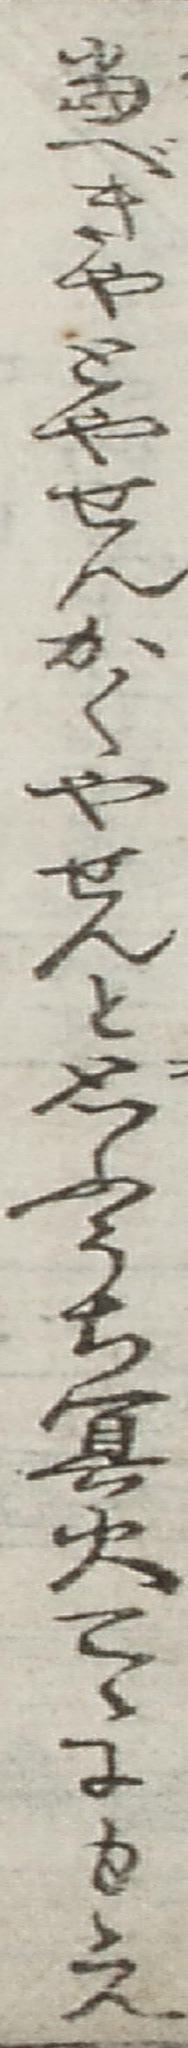当べきやとやせんかくやせんと思ふうち冥火こゝにもえ
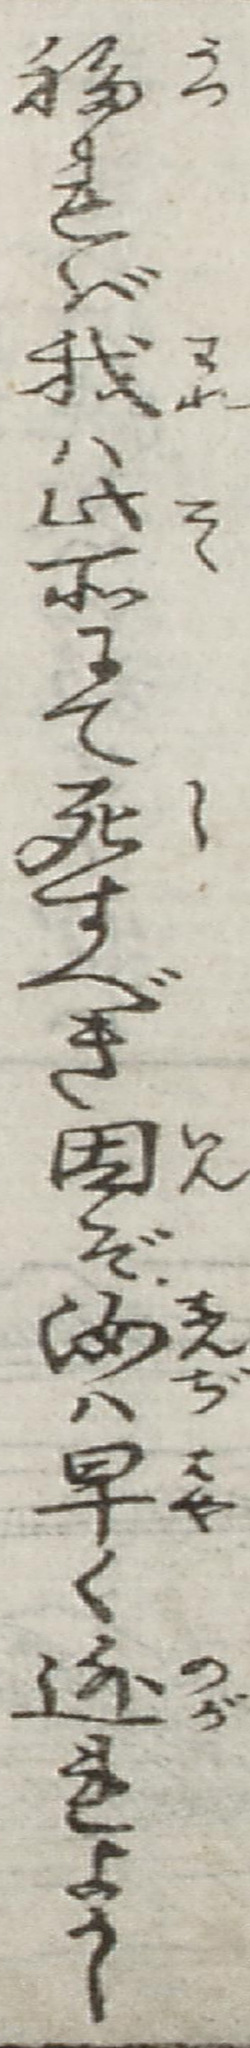移れバ我ハ此所にて死すべき因ぞ汝ハ早く逃れよかし
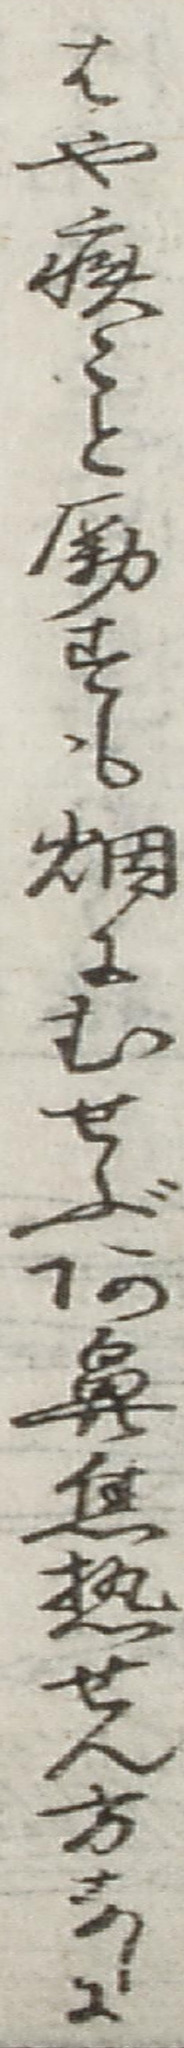はや疾〻と励すも烟にむせぶ阿鼻焦熱せん方なしに
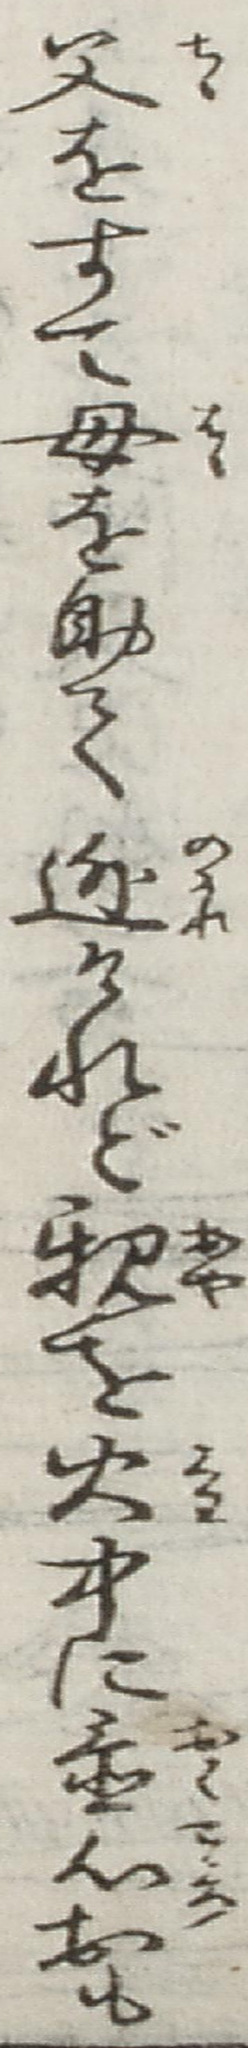父をすて母を助て逃けれど親を火中に置心おも
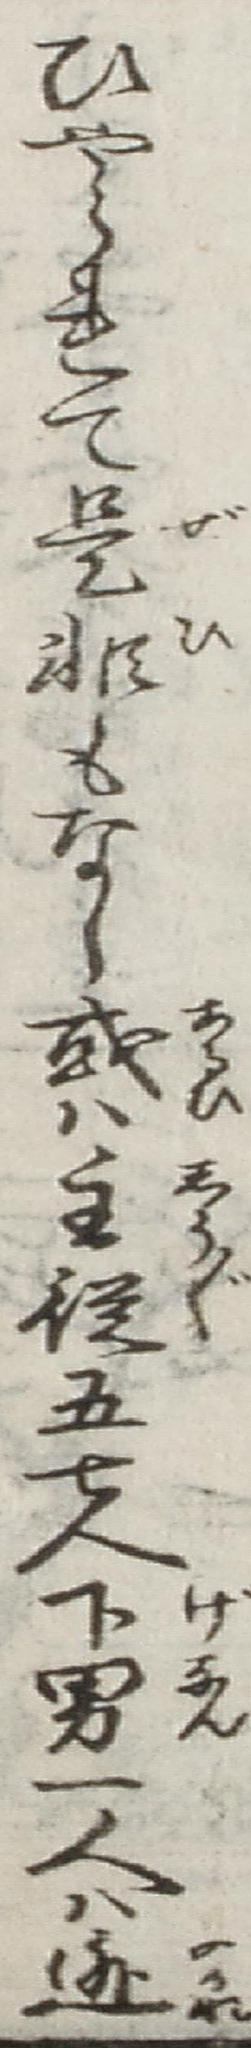ひやられて是非もなし或ハ主従五七人下男一人ハ逃
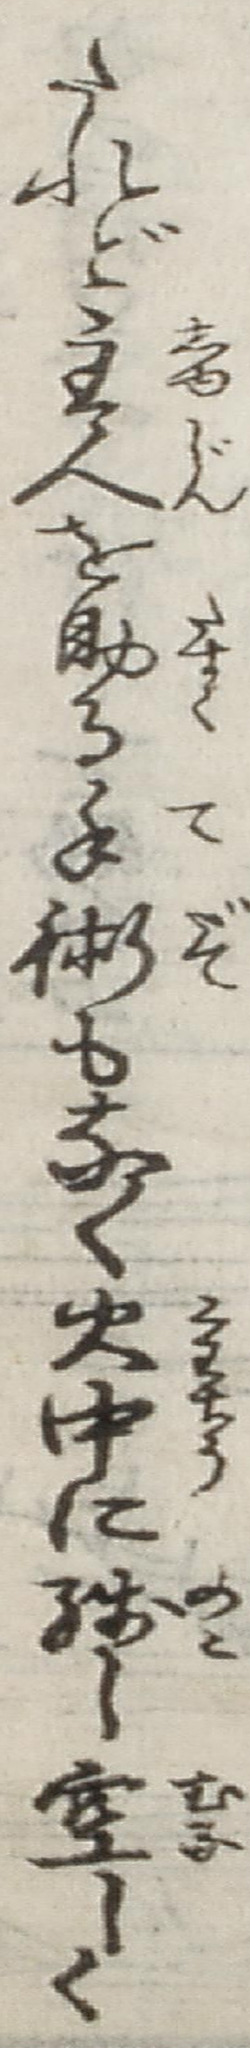たれど主人を助る手術もなく火中に残し空しく
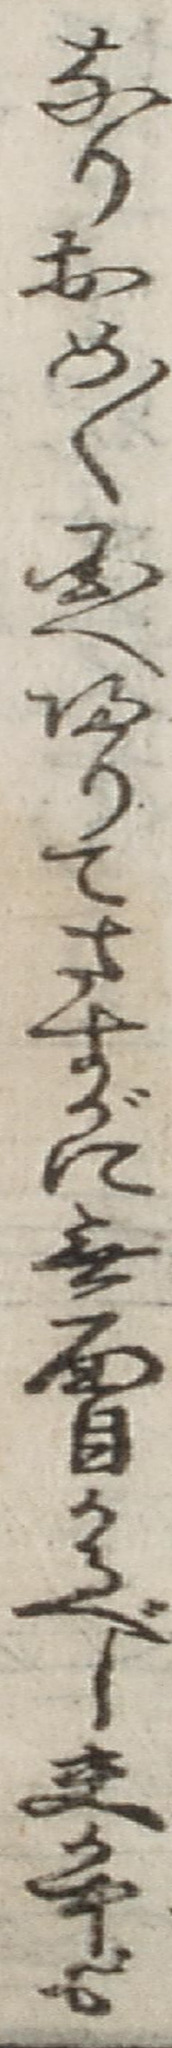なりおめ〳〵国へ帰りてさすがに無面目かるべし夫か中にも
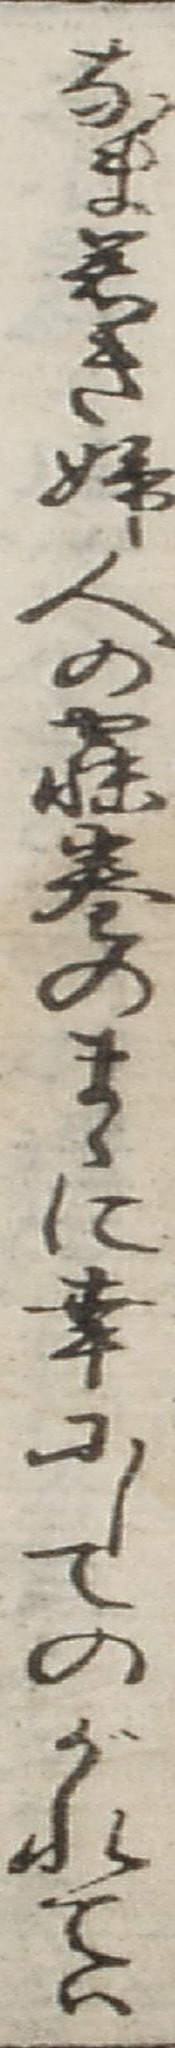なま若き婦人の寝巻のまゝに幸にしてのがれてハ
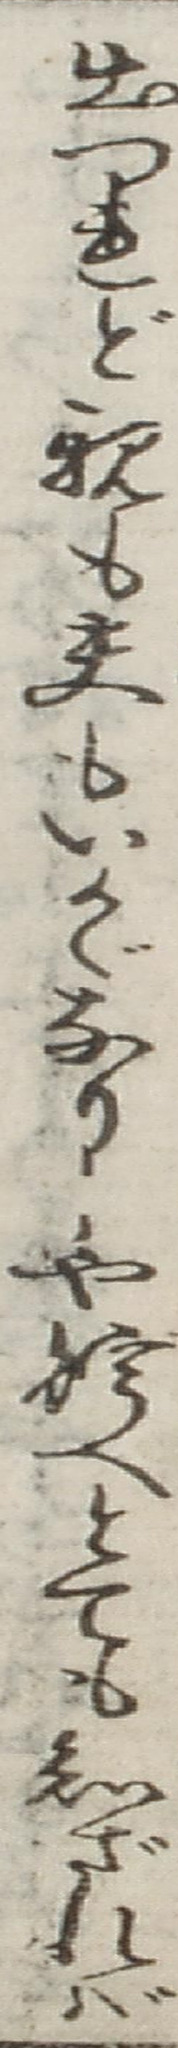出つれど親も夫もいかゞなりしや貯へとても知ざれバ
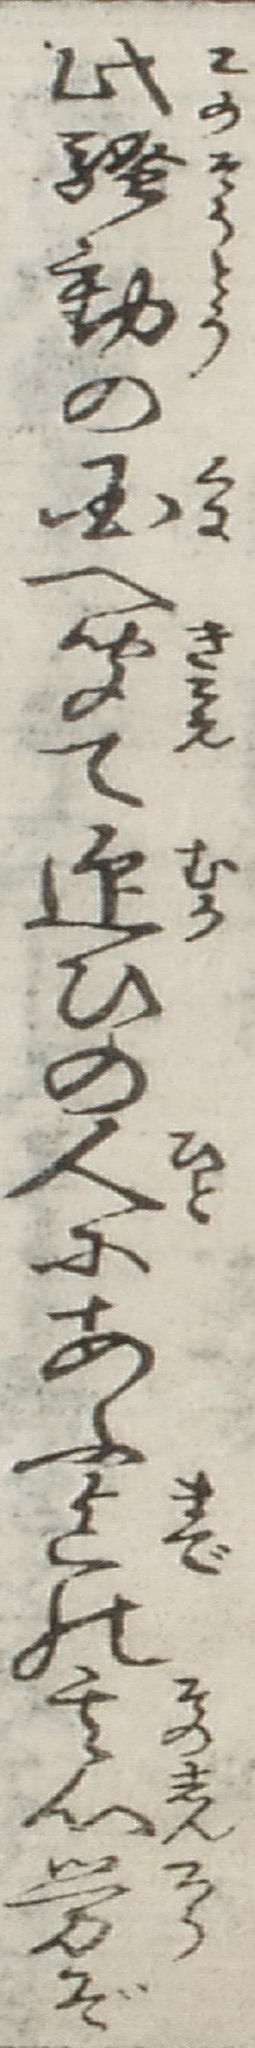此騒動の国へ聞て迎ひの人にあふ迄の其心労ぞ
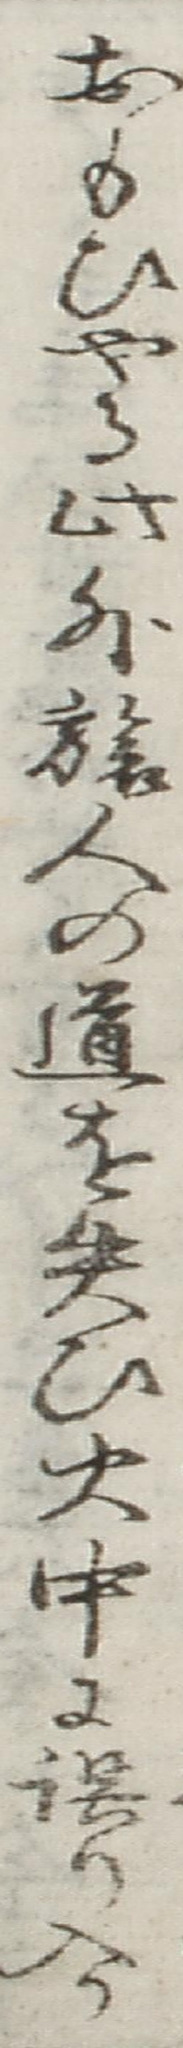おもひやる此外旅人の道を失ひ火中に誤り入り
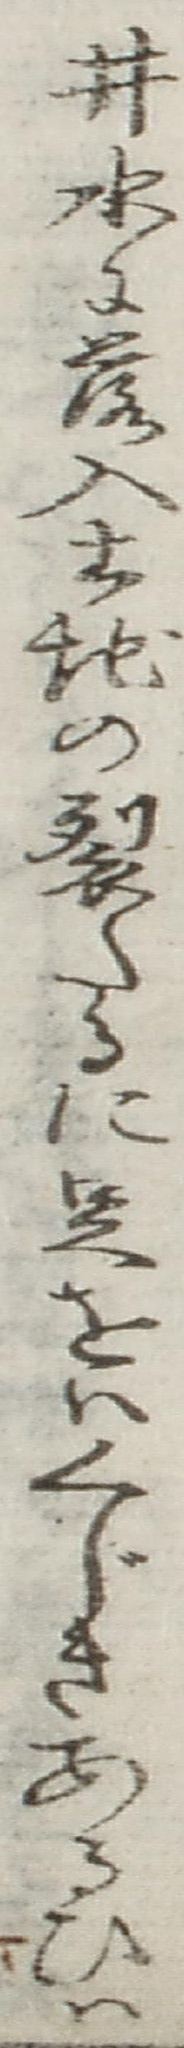井水に落入土地の裂たるに足をハくじきあるひハ
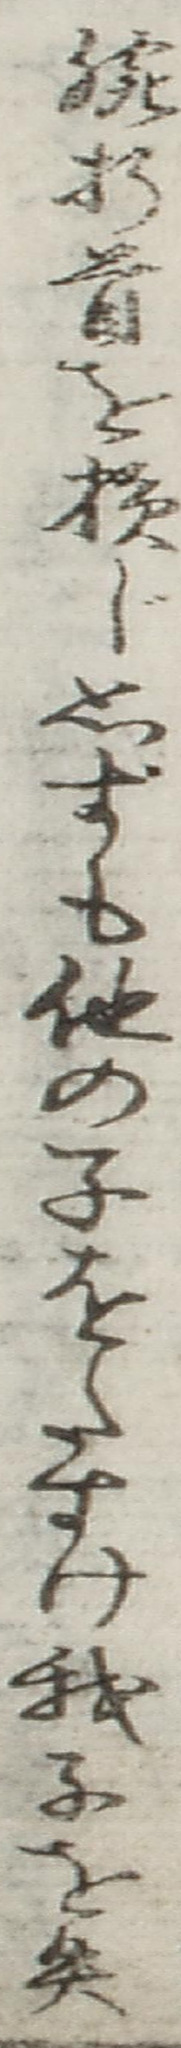腕折首損じ思ずも他の子をたすけ我子を失
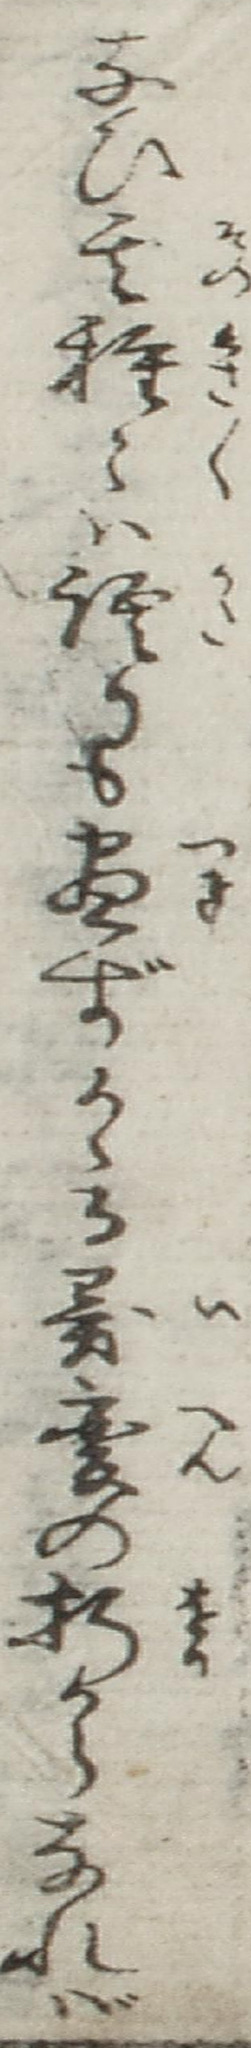なひ其種〻ハ語るも尽ずかゝる異変の折からなれば

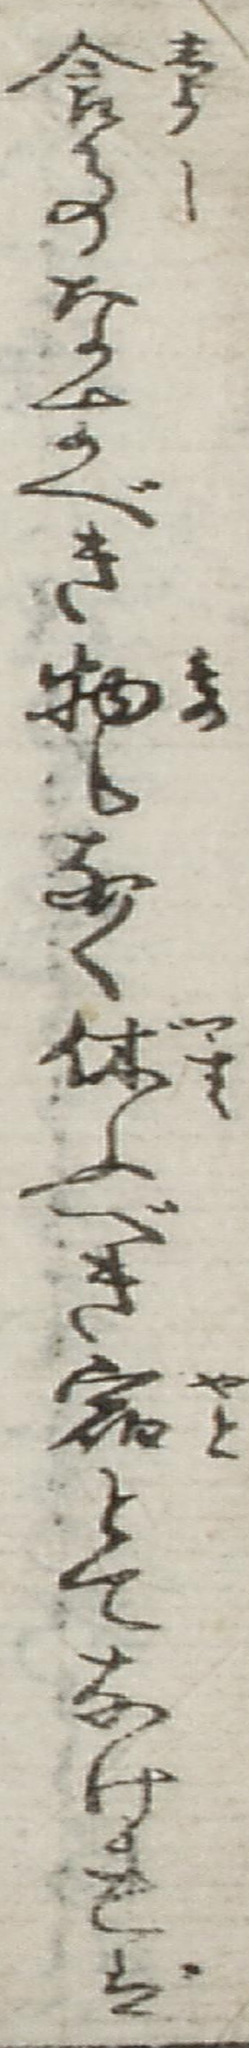食事のなすべき物もなく休ふべき宿とてなければ
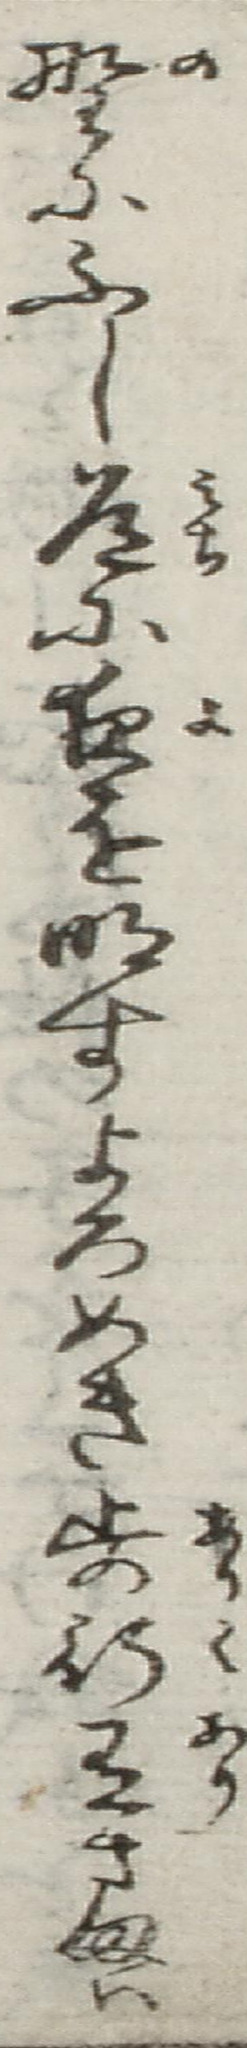野にふし道に夜を明すよろめき歩行有さまハ
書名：地震世直草紙　全
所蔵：東京大学地震研究所図書室 Earthquake Research Institute Library, The University of Tokyo, JAPAN
